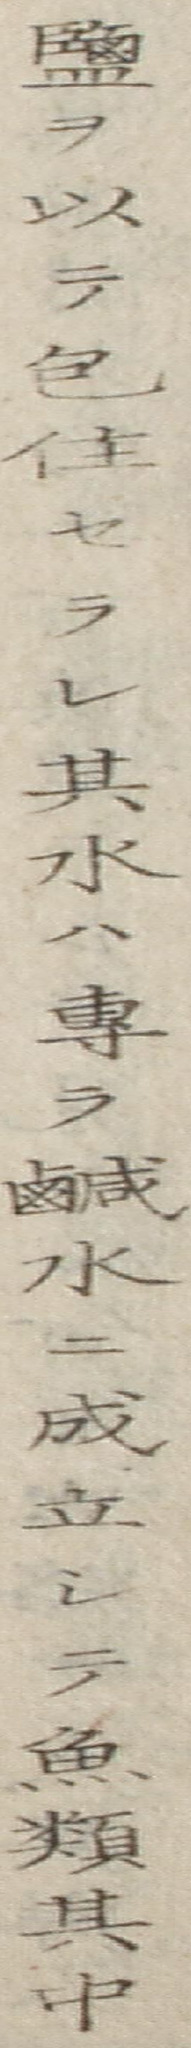塩ヲ以テ包住セラレ其水ハ専ラ鹹水ニ成立シテ魚類其中
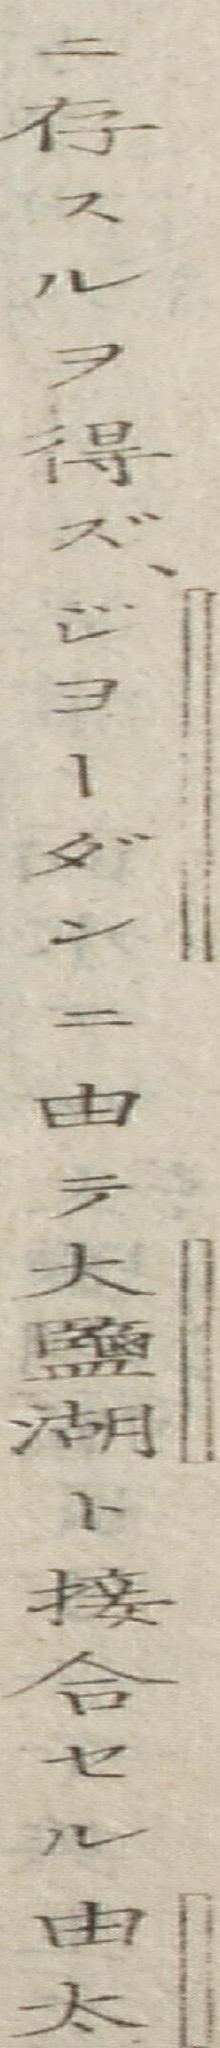ニ存スルヲ得ズ、ジョーダンニ由テ大塩湖ト接合セル由太
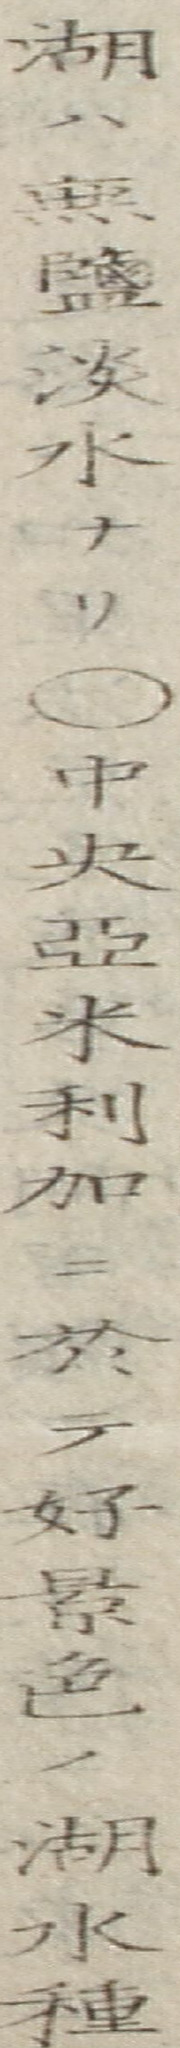湖ハ無塩淡水ナリ○中央亜米利加ニ於テ好景色ノ湖水種
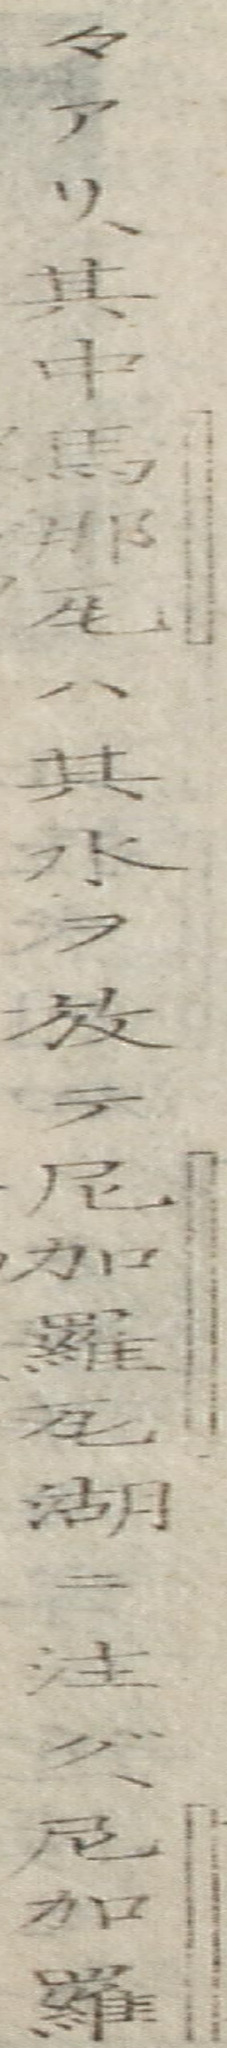々アリ、其中馬那瓦ハ其水ヲ放テ尼加羅瓦湖ニ注グ、尼加羅
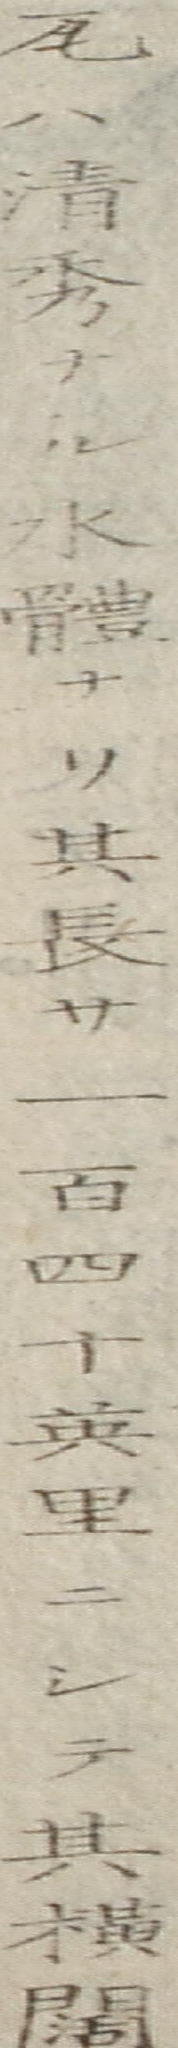瓦ハ清秀ナル水体ナリ其長サ一百四十英里ニシテ其横闊
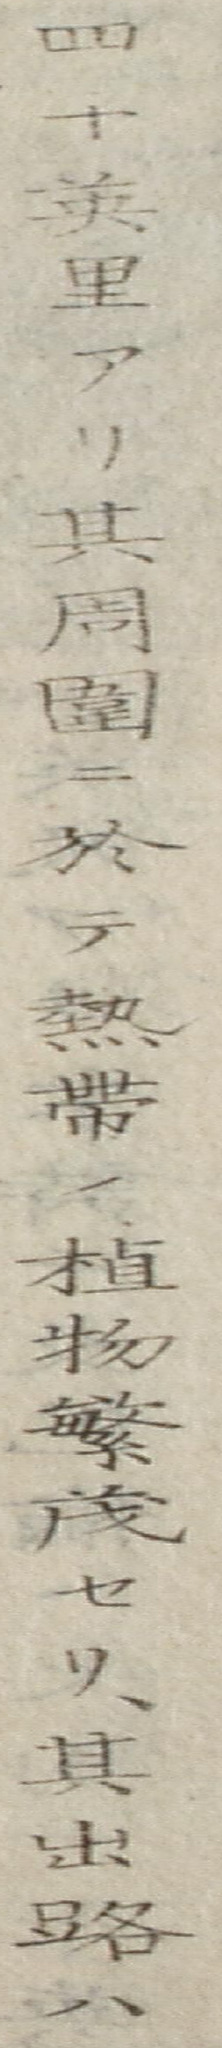四十英里アリ其周囲ニ於テ熱帯ノ植物繁茂セリ、其出路ハ
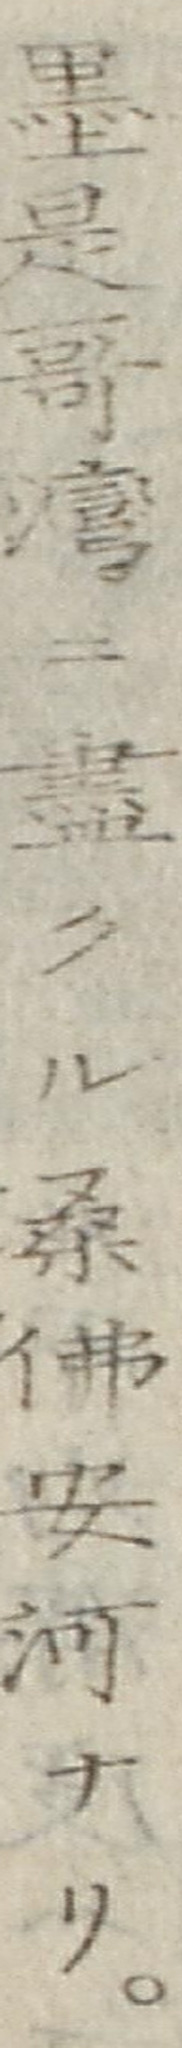墨是哥湾ニ尽クル桑佛安河ナリ。
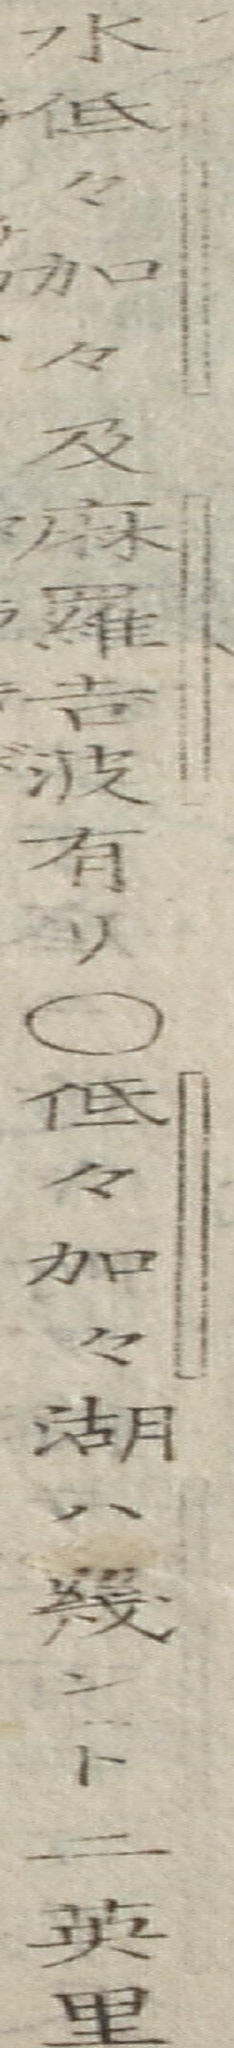水低々加々及麻羅吉波有リ○低々加々湖ハ幾ント二英里
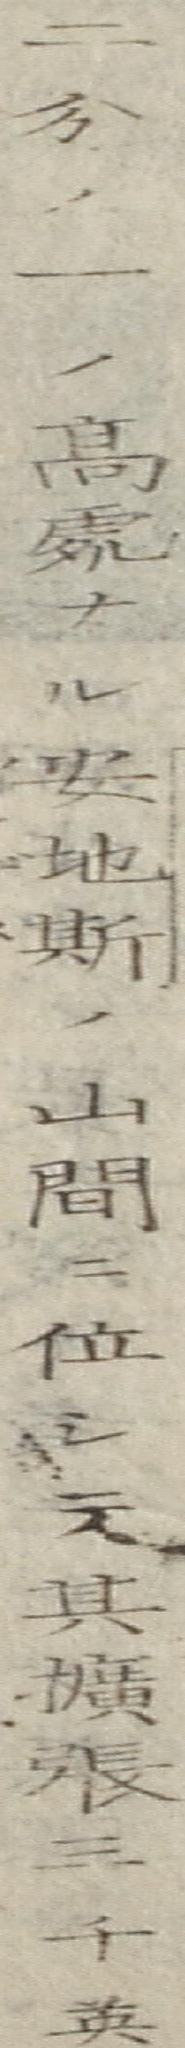二分ノ一ノ高処ナル安地斯ノ山間ニ位シテ其拡張三千英
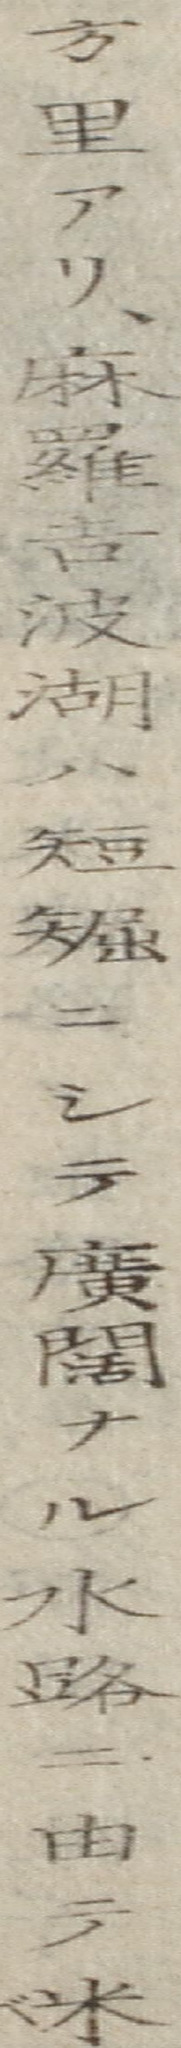方里アリ、麻羅吉波湖ハ短掘ニシテ広闊ナル水路ニ由テ米
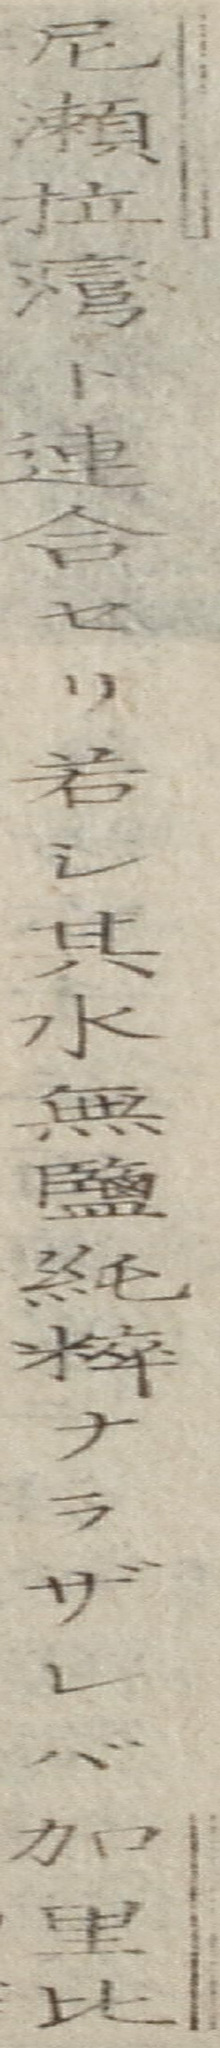尼瀬拉湾ト連合セリ若シ其水無塩純粋ナラザレバ加里比
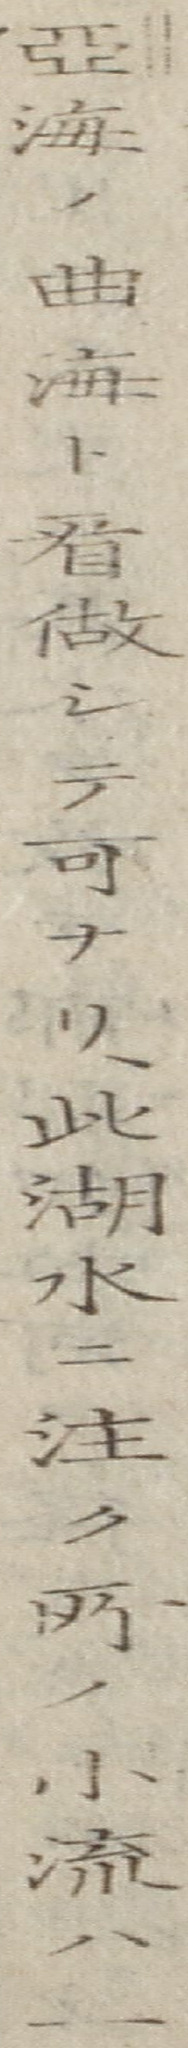亜海ノ曲海ト看做シテ可ナリ、此湖水ニ注ク所ノ小流ハ一
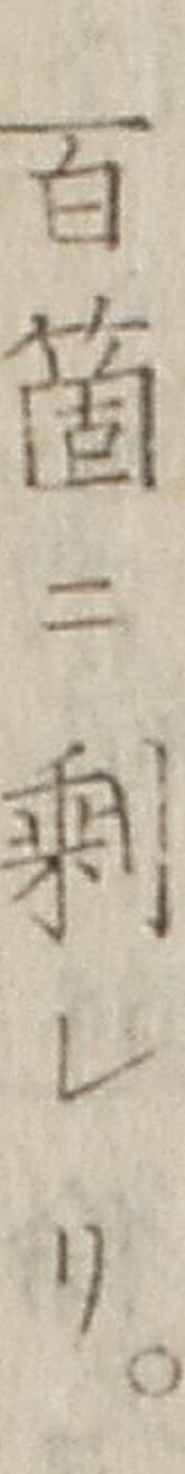百箇ニ剰レリ。
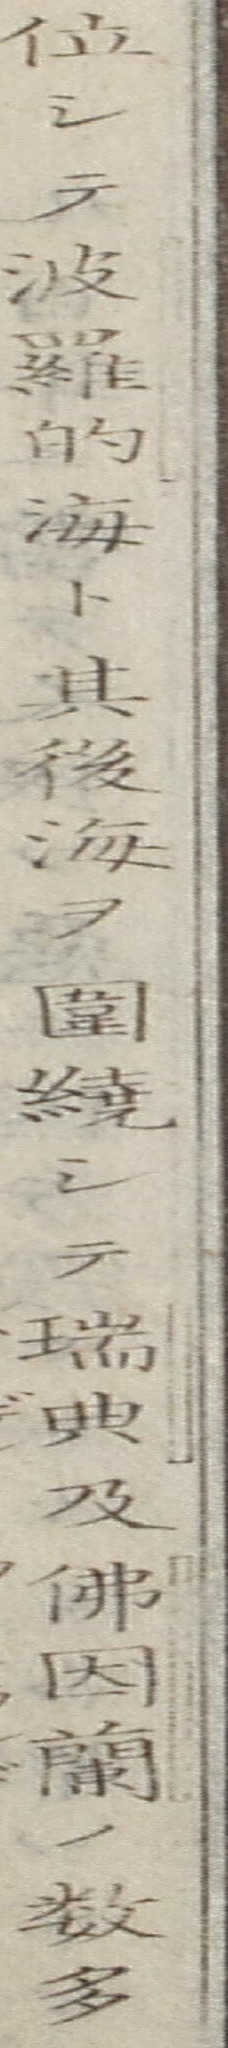位シテ波羅的海ト其後海ヲ囲続シテ瑞典及佛因蘭ノ数多
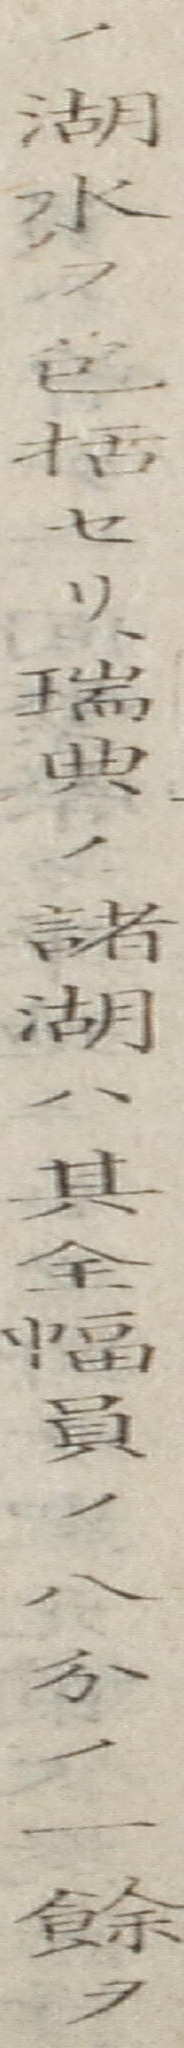ノ湖水ヲ包括セリ、瑞典ノ諸湖ハ其全幅員ノ八分ノ一余ヲ
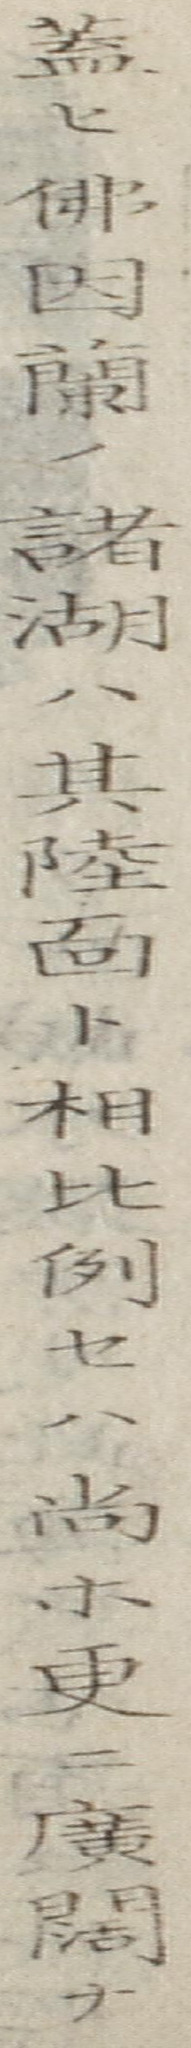蓋ヒ佛因蘭ノ諸湖ハ其陸面ト相比例セハ尚ホ更ニ広闊ナ
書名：地形論　巻二
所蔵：東京大学地震研究所図書室 Earthquake Research Institute Library, The University of Tokyo, JAPAN
